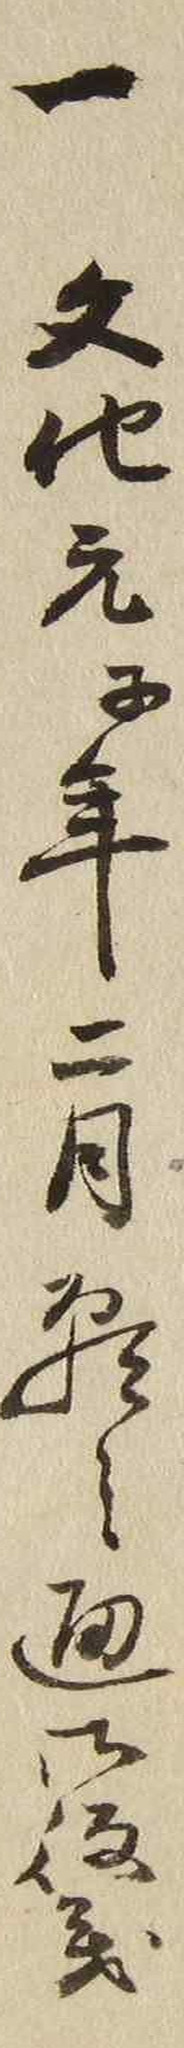一文化元子年二月願之通御役義
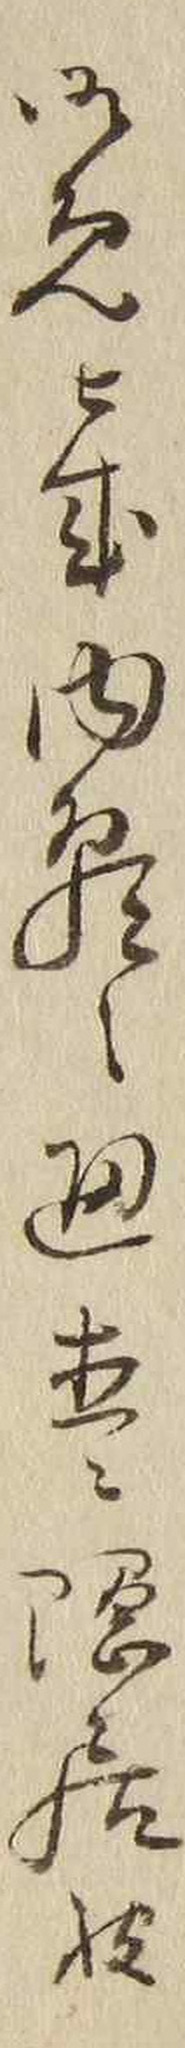御免被成内願之通直ニ隠居被
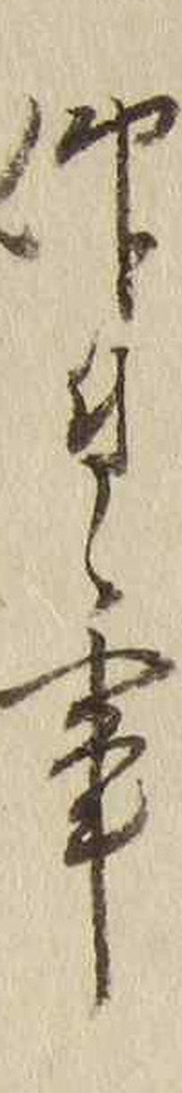仰付候事
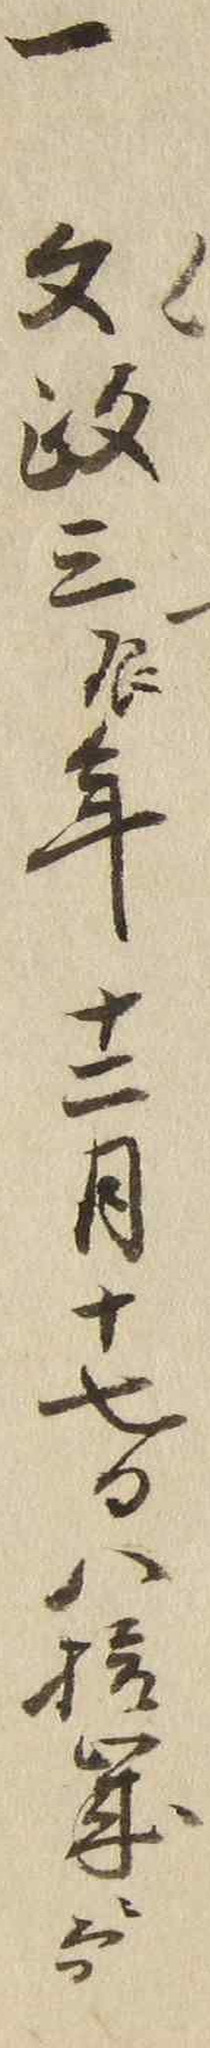一文政三辰年十二月十七日八拾歳ニ而

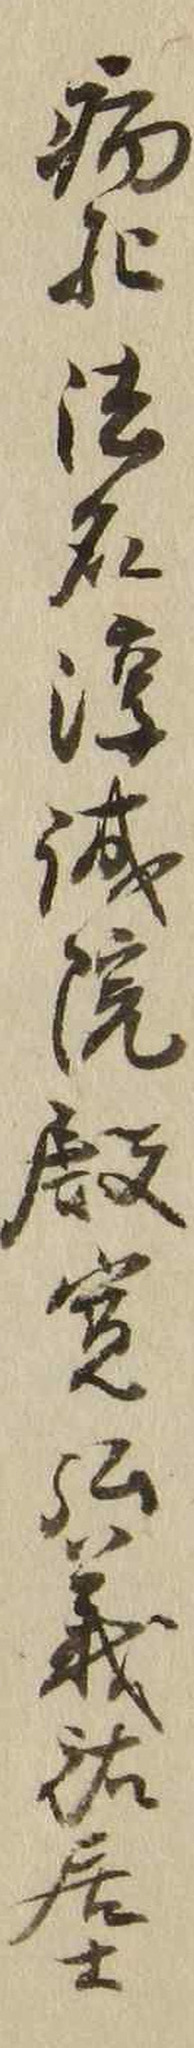病死法名浮誠院殿寛弘義祐居士
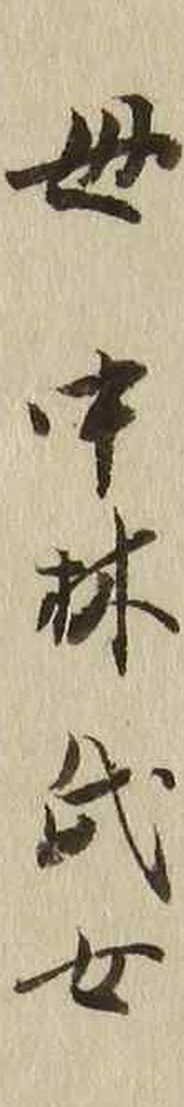女中林氏女
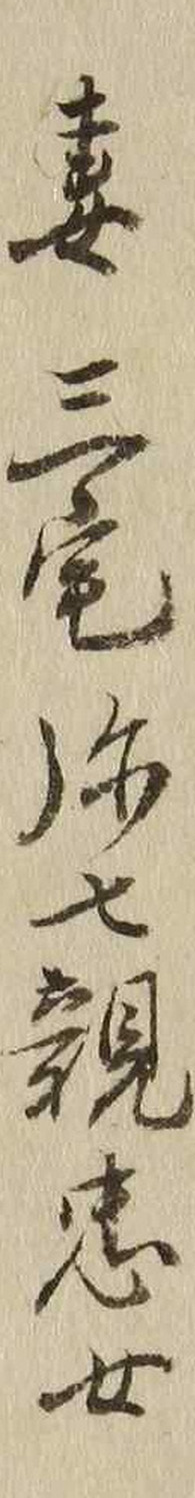妻三宅弥七親忠女
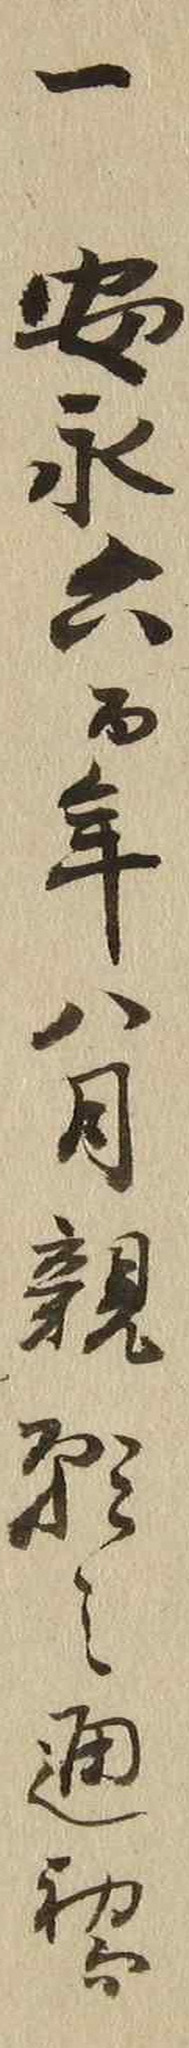一安永六酉年八月親願之通初而
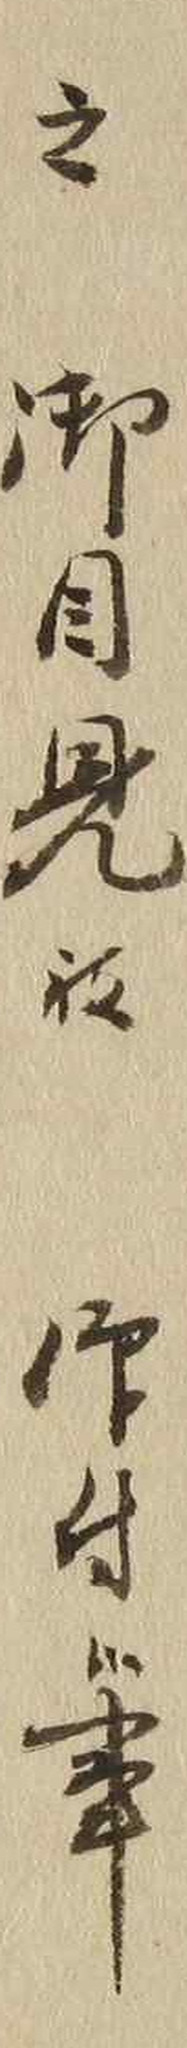之御目見被仰付候事
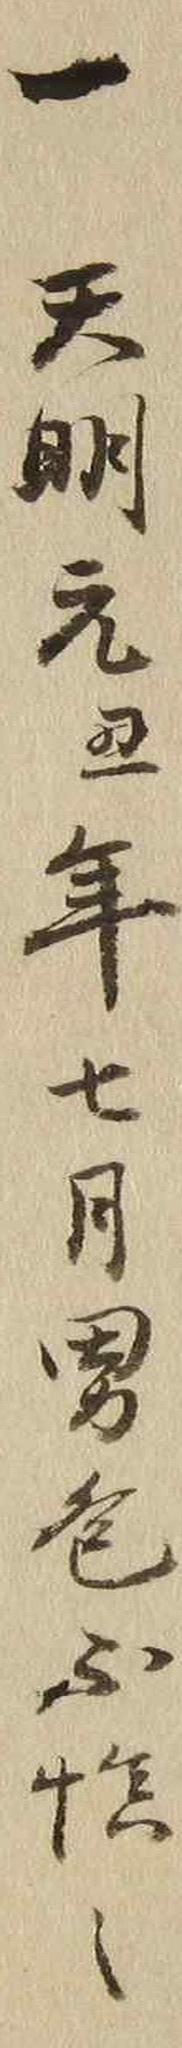一天明元丑年七月男色不慎之
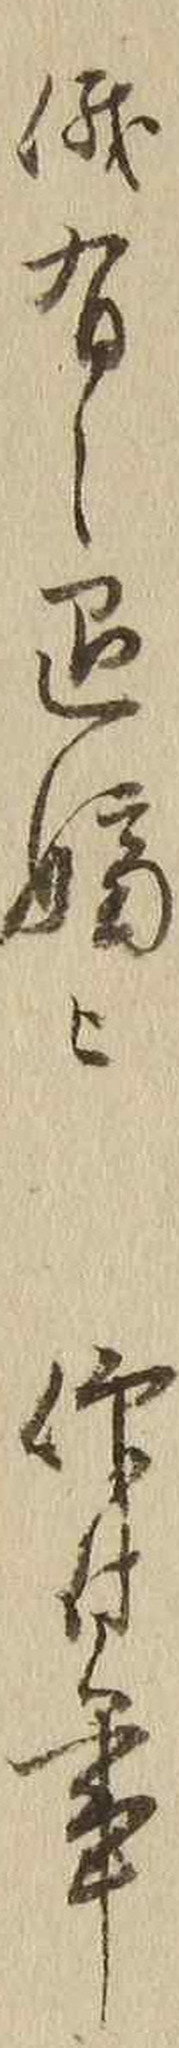儀有之退嫡被仰付候事
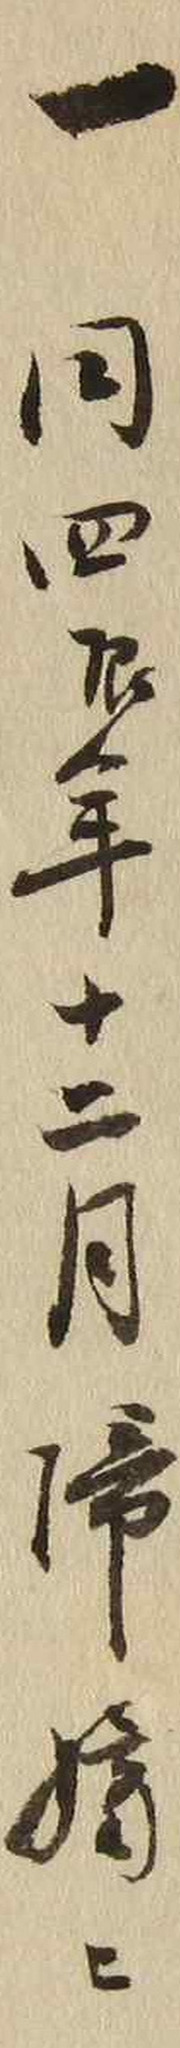一同四辰年十二月帰嫡被
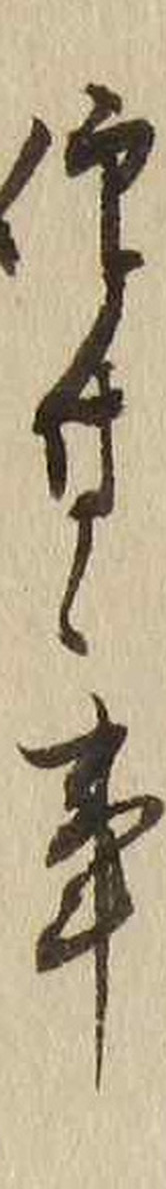仰付候事
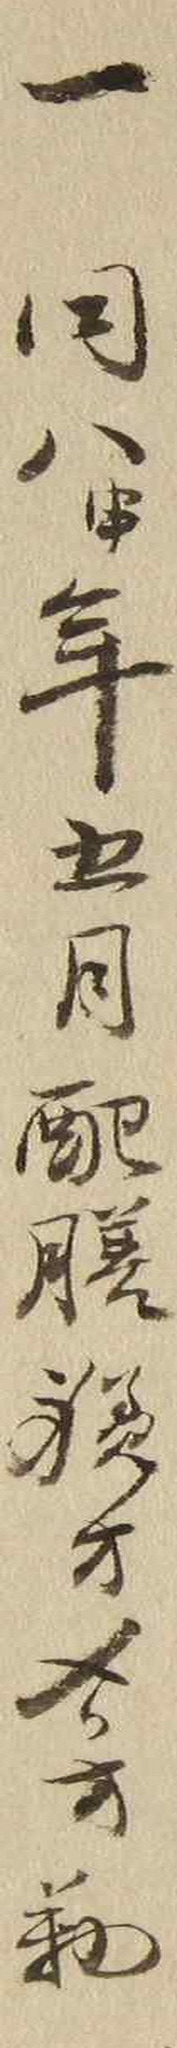一同八申年五月配膳躾方〆り方勤
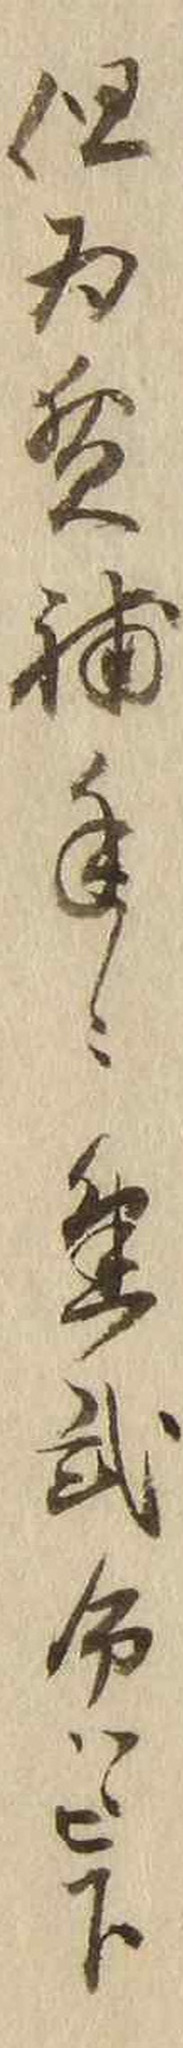但為費補年ニ金弐分ツヽ被下

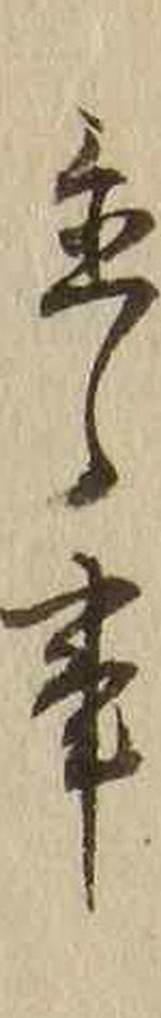置候事
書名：諸士系譜　巻之225　ま之部6
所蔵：会津若松市立会津図書館
